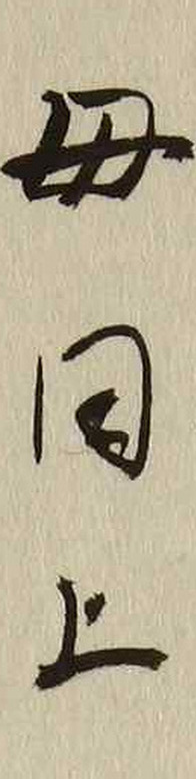母同上
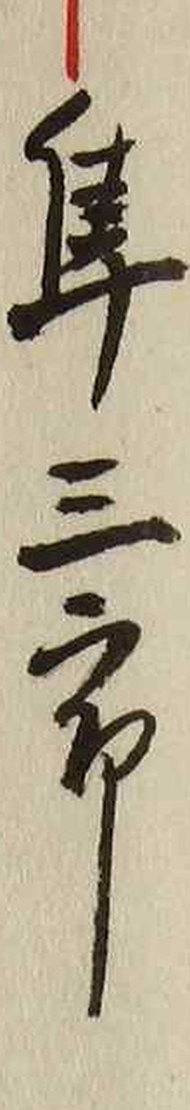隼三郎
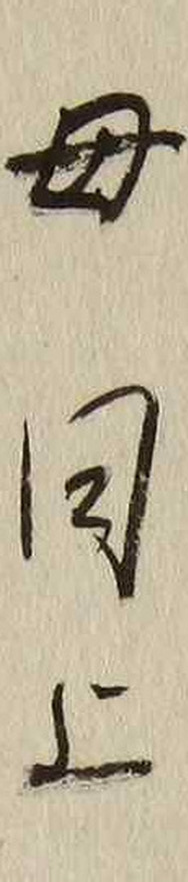母同上
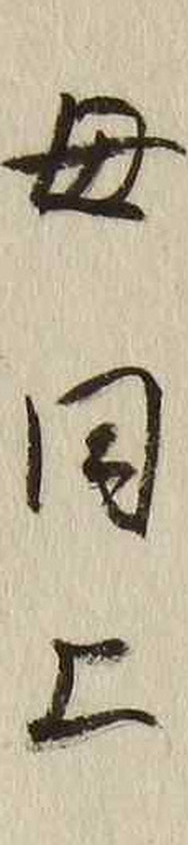母同上
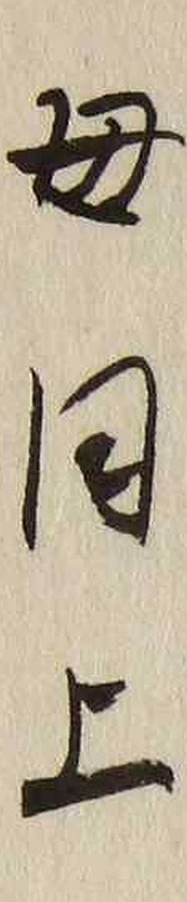母同上

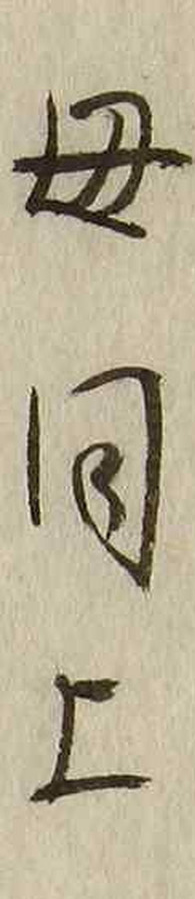母同上
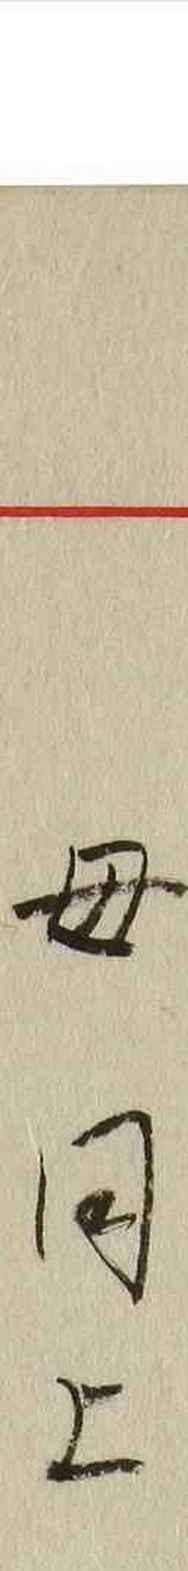母同上
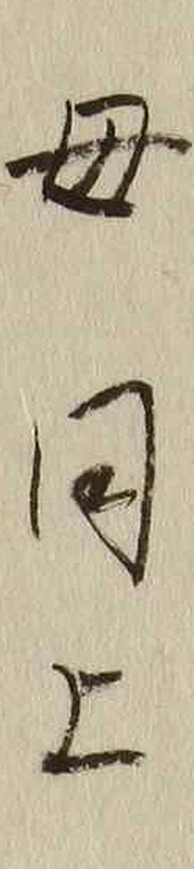母同上
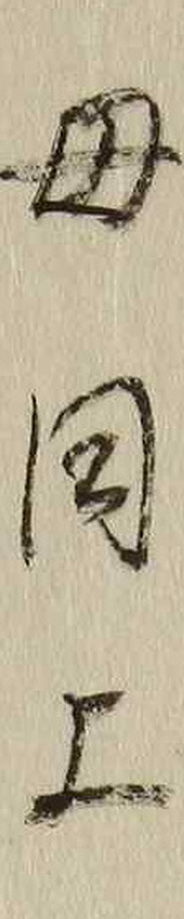母同上
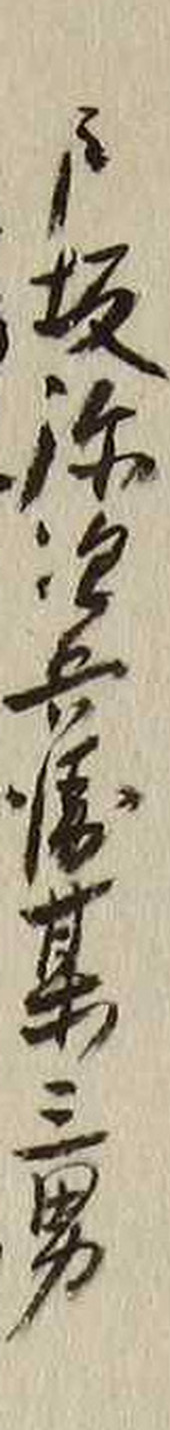戸坂弥次兵衛某三男
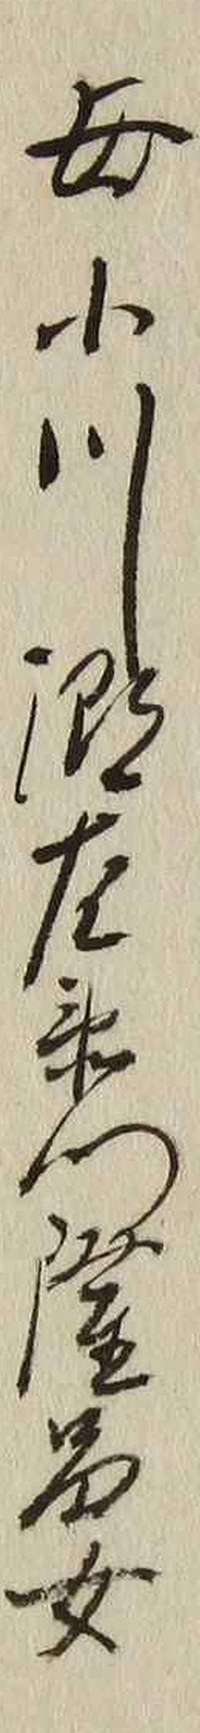母小川郷左衛門隆品女
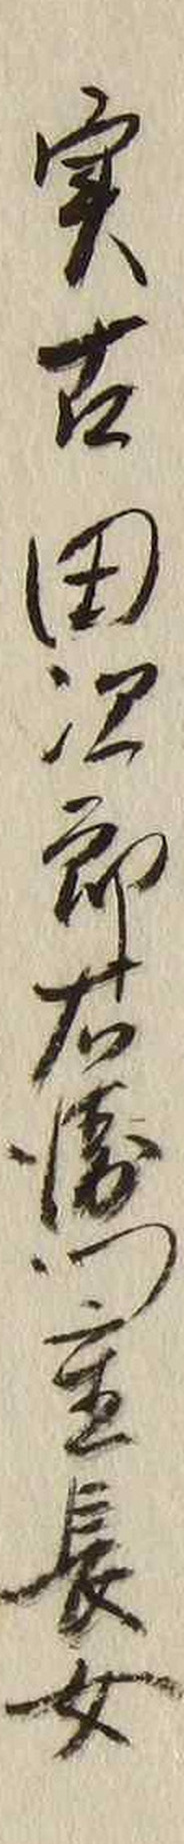実古田次郎右衛門重長女

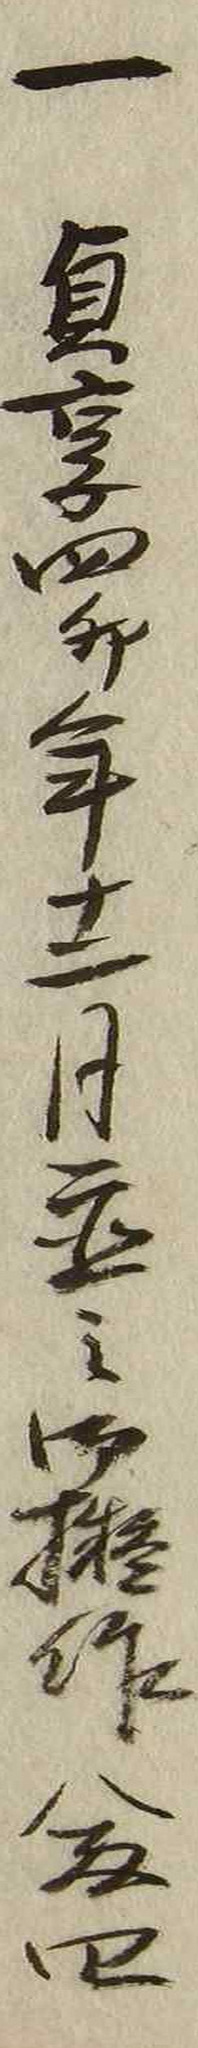一貞享四卯年十二月並之御擬作八両四
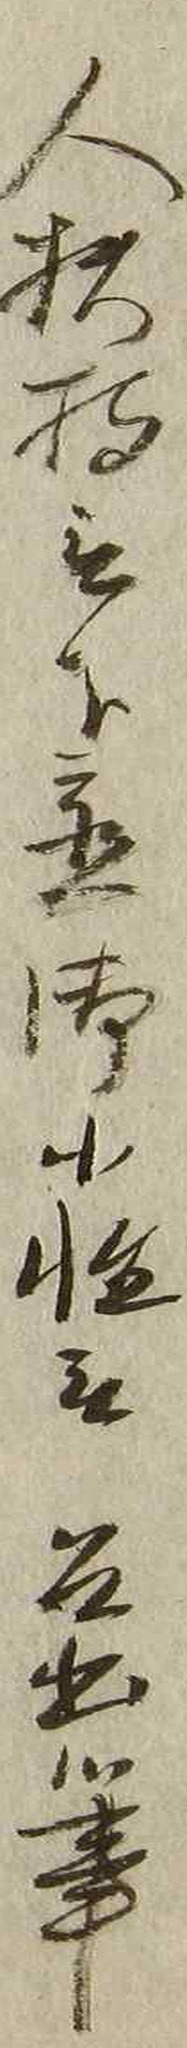人扶持被下置御小性被召出候事
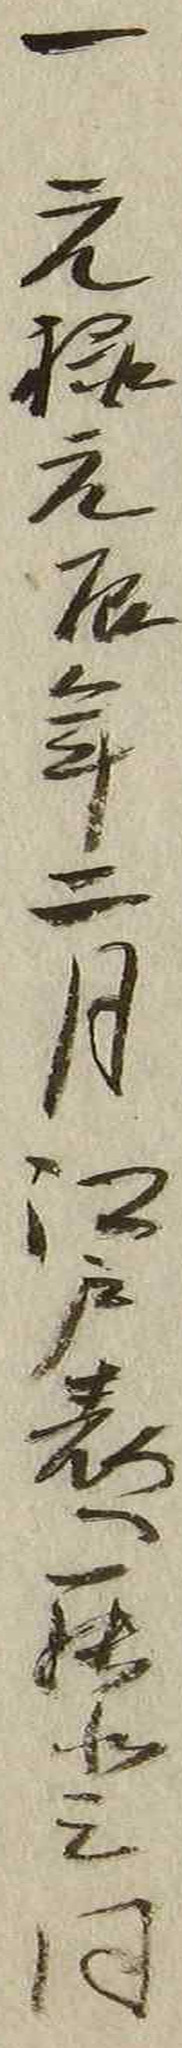一元様元辰年二月江戸表へ罷登同
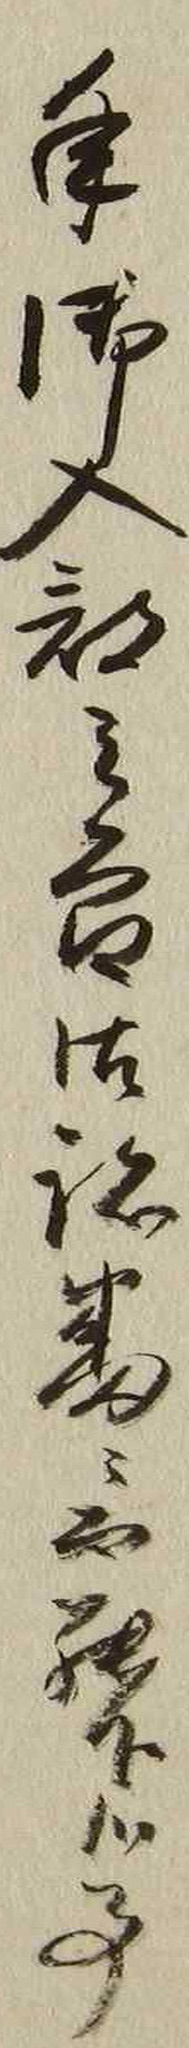年御入部之節御跡番ニ而罷下候事
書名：諸士系譜　巻之346　も之部2
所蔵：会津若松市立会津図書館
